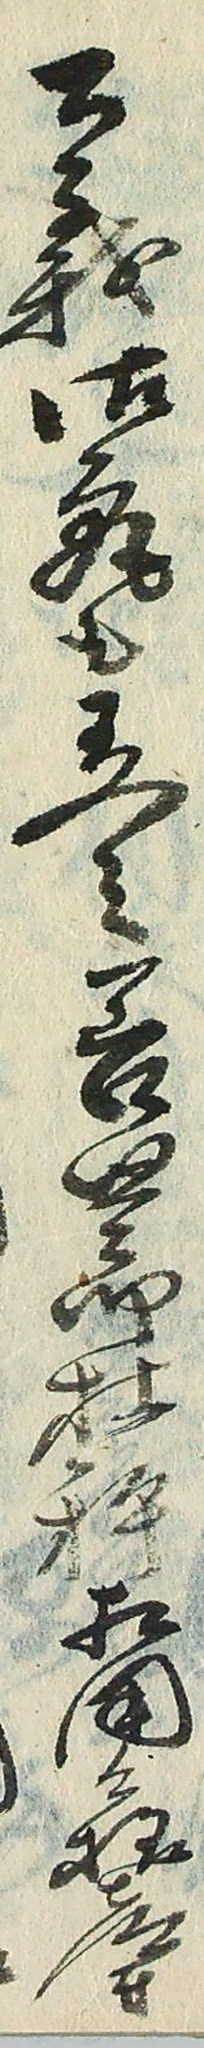公義御究も有之善四郎杜秤相用候様被仰付
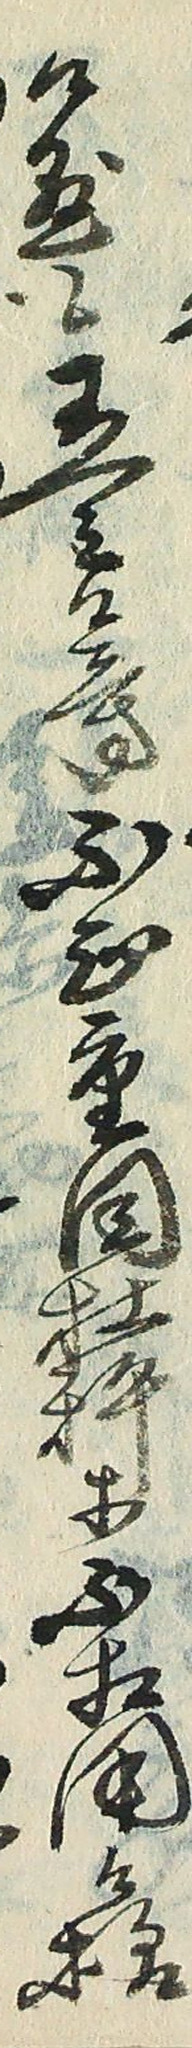候懸も有之候旁不正重目杜秤等不相用候様
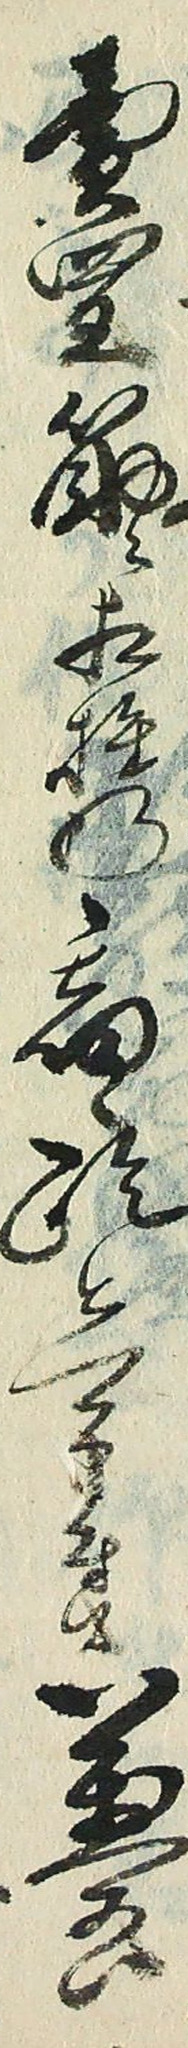売買筋に相携候者へ屹と可申付候万一右
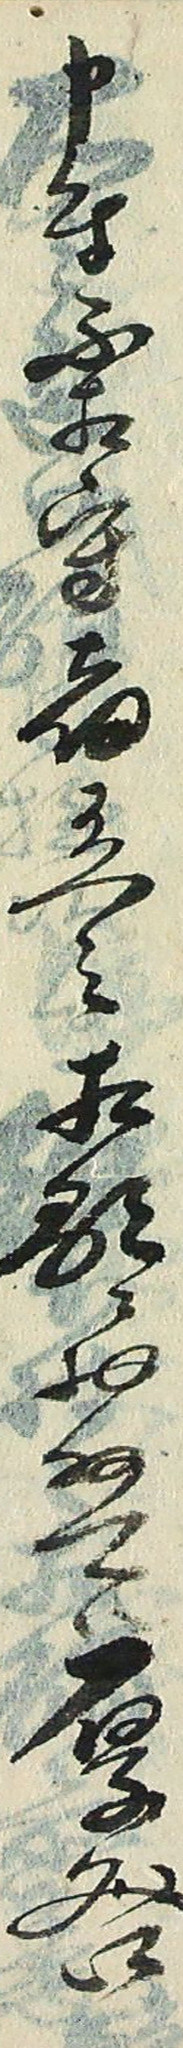申付不相守者有之相顕におゐては厚咎
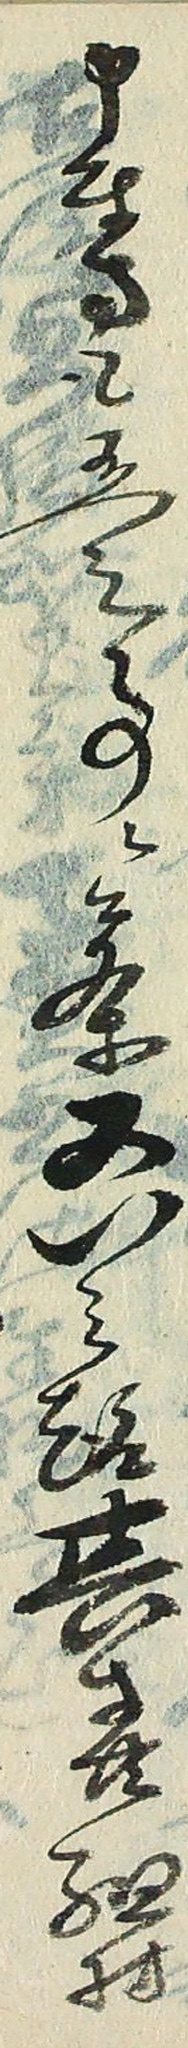申付方も有之事に候条右之趣其方共組村
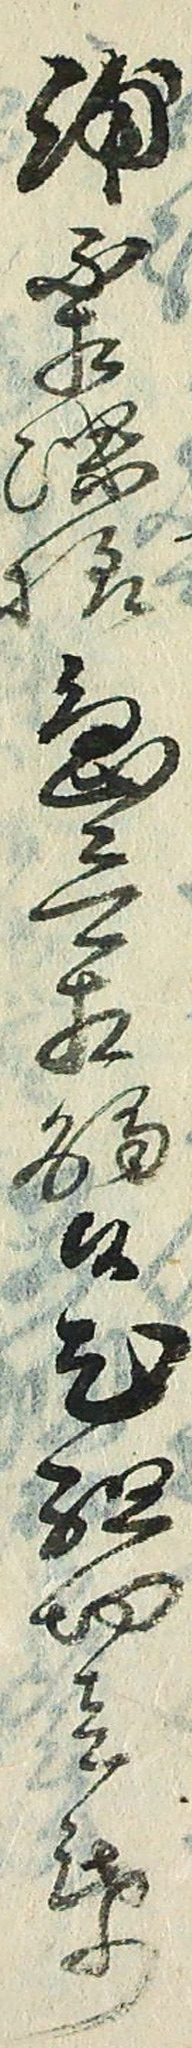浦不相洩様急々可相触候尤組切壱帋
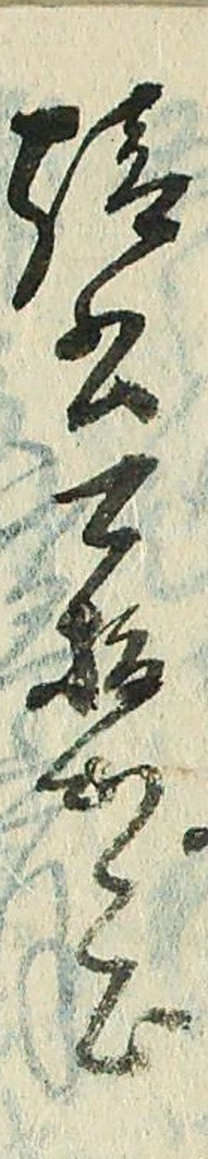請書可指出候以上
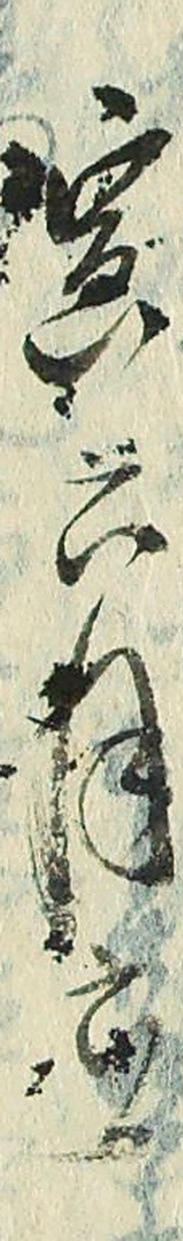寅六月六日
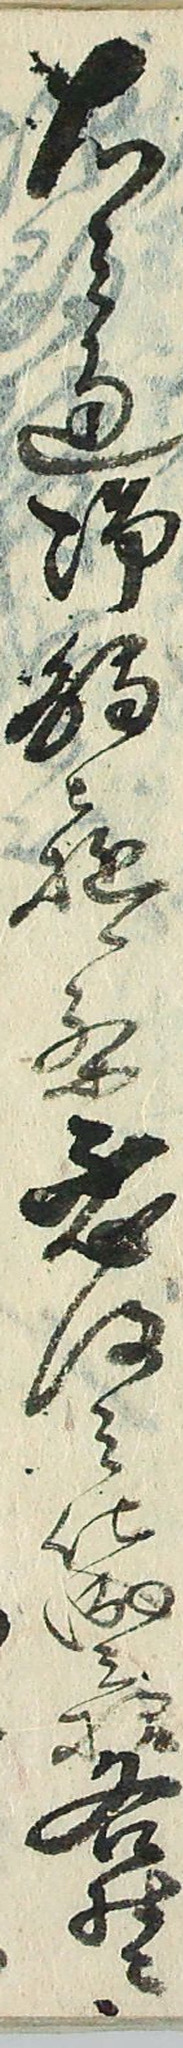右之通御触被遊候条不心得之仕成之様各村々
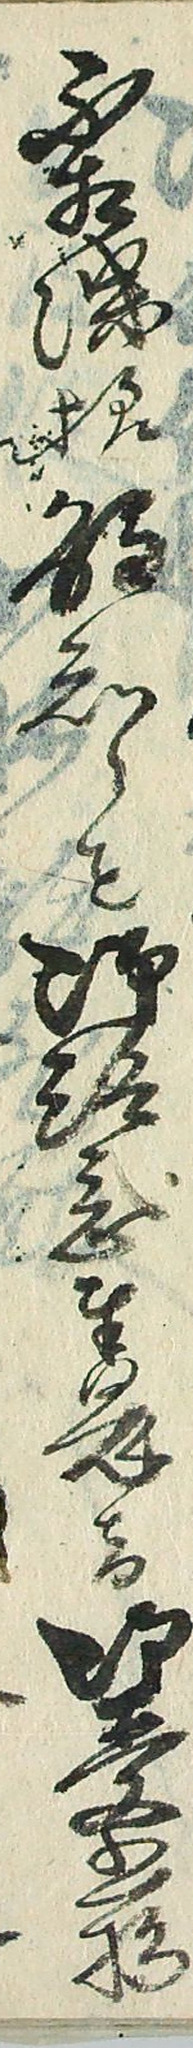不相洩様触知らせ御趣意奉畏旨御受書指
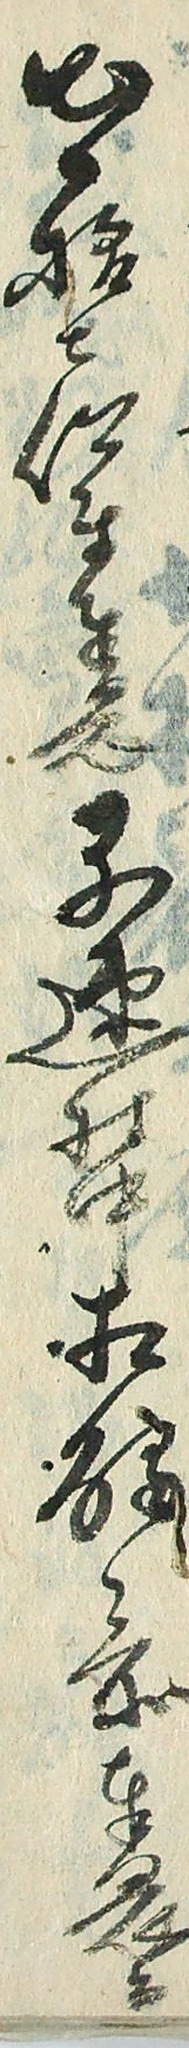出候様被仰付奉畏早速村中相触候所奉畏旨

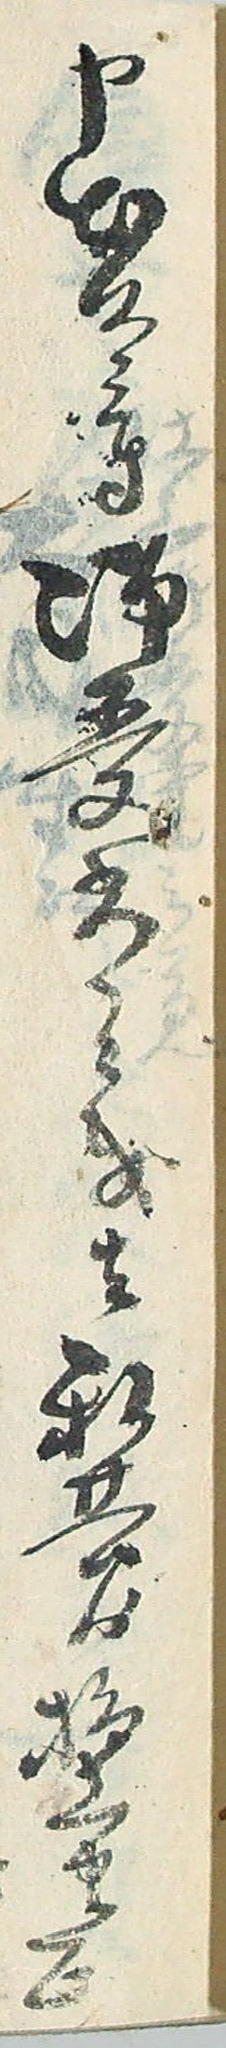申出候に付御受書之義は私共ゟ指上申候以上
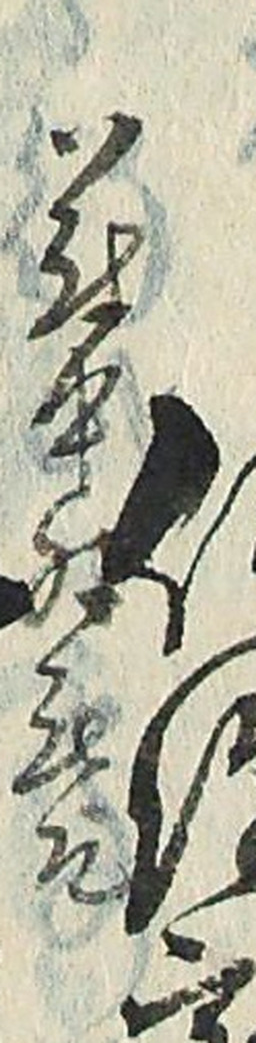府中村庄屋
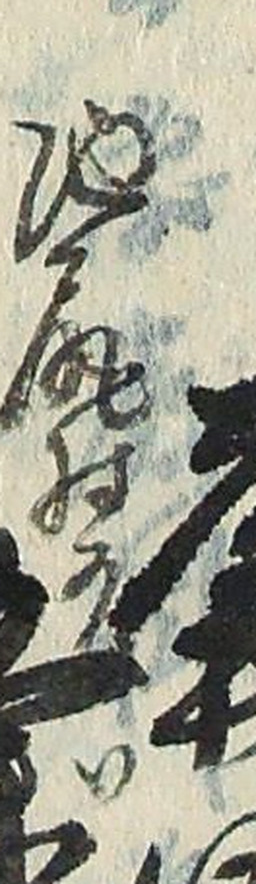池尻村右同
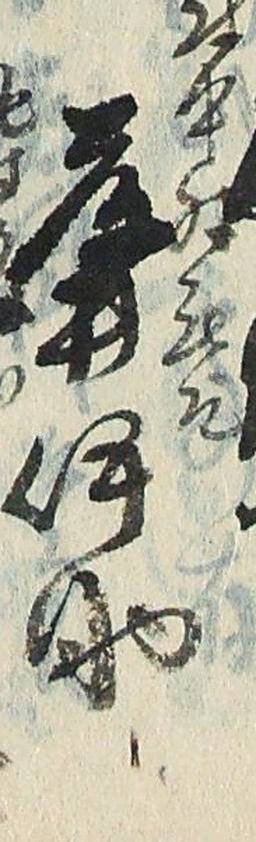藤井伊助
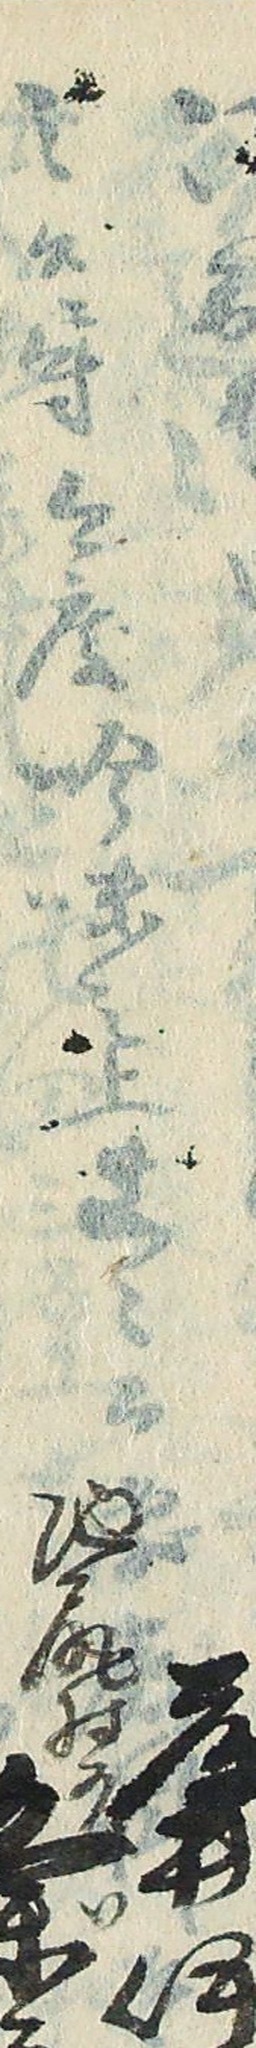池尻村右同
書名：諸御用御□受書控
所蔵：鳴門教育大学 Naruto University of Education
